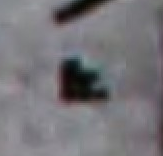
??.
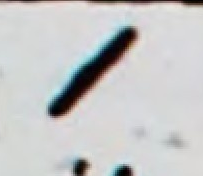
1
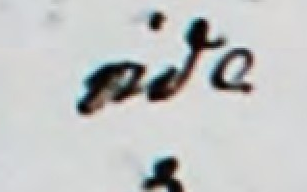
vide
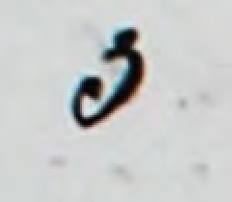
3
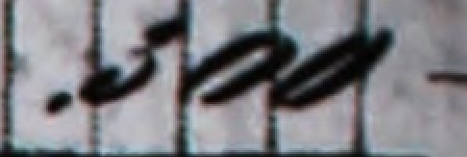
300 –
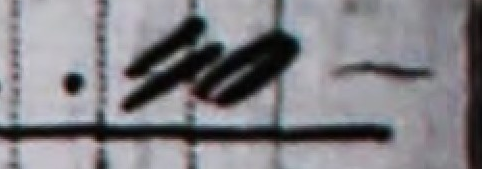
40 –
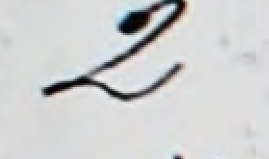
2
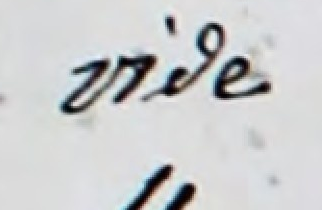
vide
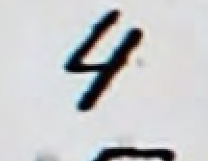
4
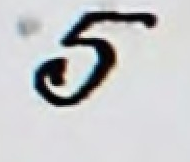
5
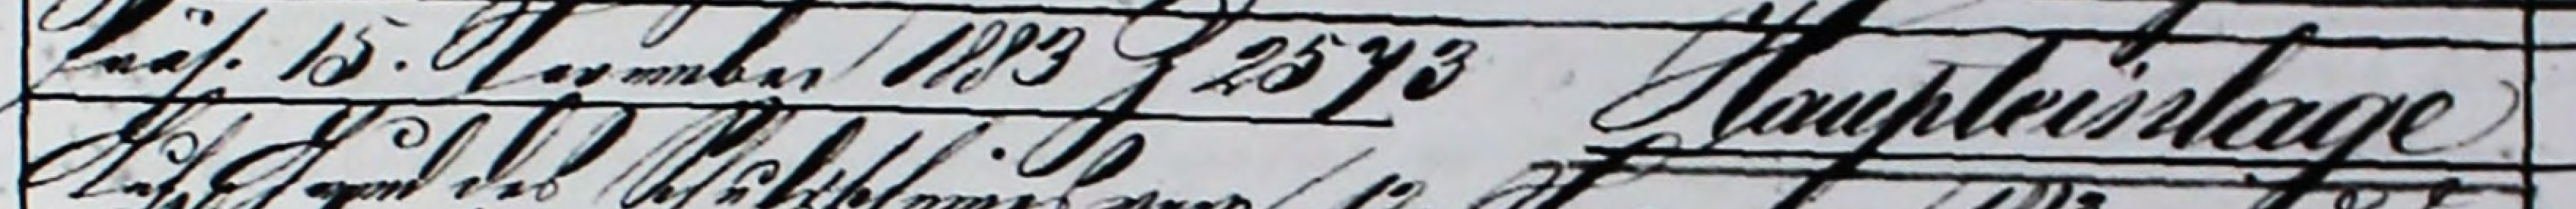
Präs: 15. Dezember 1883 Z 2573 Haupteinlage
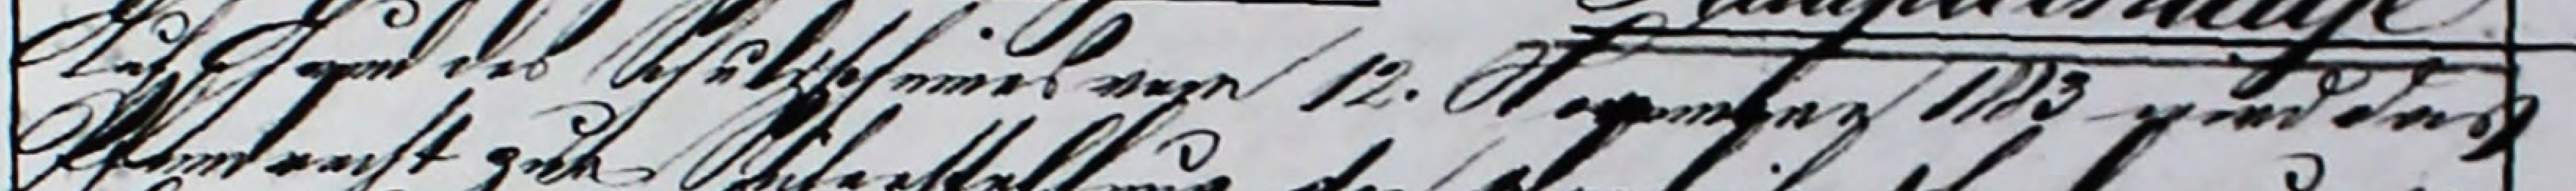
Auf Grund des Schuldscheines vom 12. November 1883 wird das
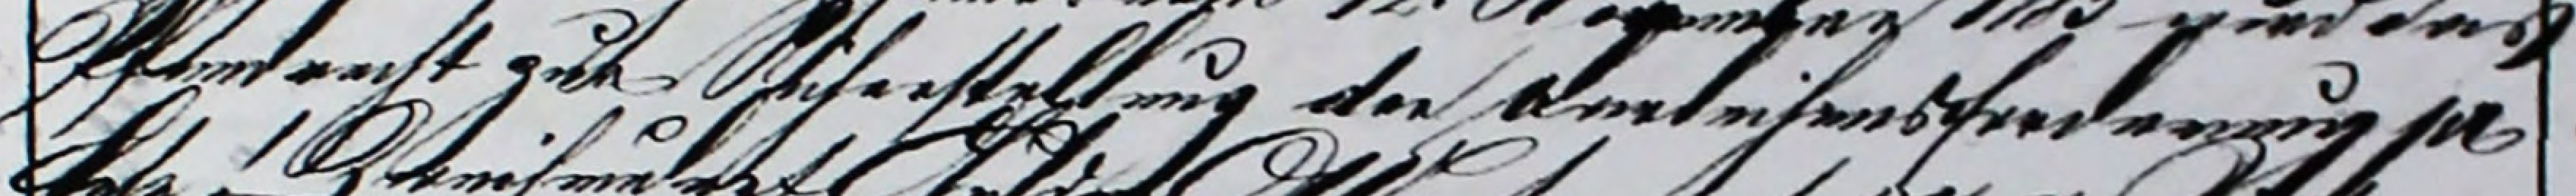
Pfandrecht zur Sicherstellung der Darleihensforderung pr
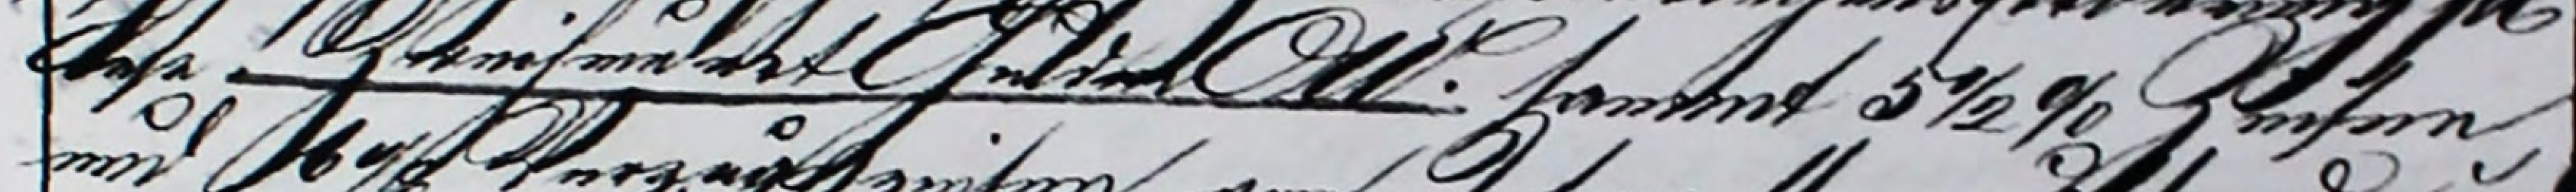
Lese Zweihundert Gulden OW. sammt 5 1/2 % Zinsen
